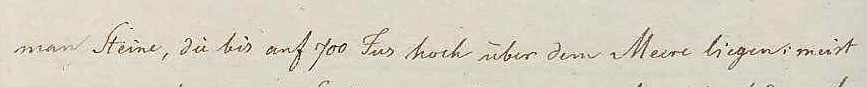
man Steine, die bis auf 700 Fus hoch über dem Meere liegen: meist
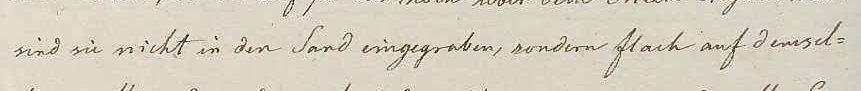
sind sie nicht in den Sand eingegraben, sondern flach auf demsel-
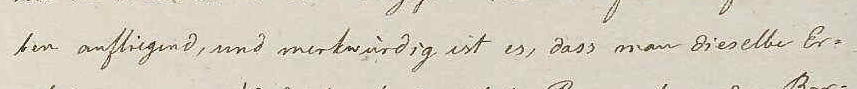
ben aufliegend, und merkwürdig ist es, dass man dieselbe Er-
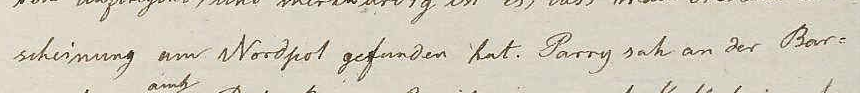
scheinung am Nordpol gefunden hat. Parry sah an der Bar-
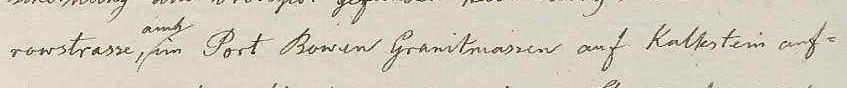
rowstrasse, auch im Port Bowen Granitmassen auf Kalkstein auf-
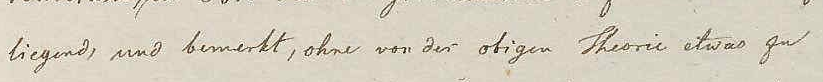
liegend, und bemerkt, ohne von der obigen Theorie etwas zu
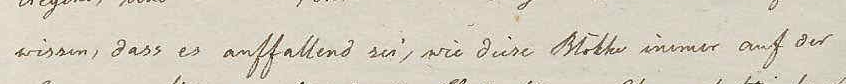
wissen, dass es auffallend sei, wie diese Blökke immer auf der
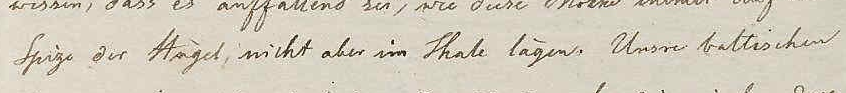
Spize der Hügel, nicht aber im Thale lägen. Unsre baltischen
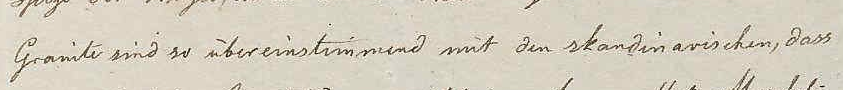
Granite sind so übereinstimmend mit den skandinavischen, dass
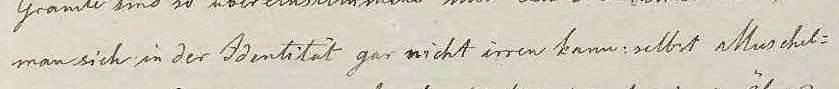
man sich in der Identität gar nicht irren kann: selbst Muschel-
